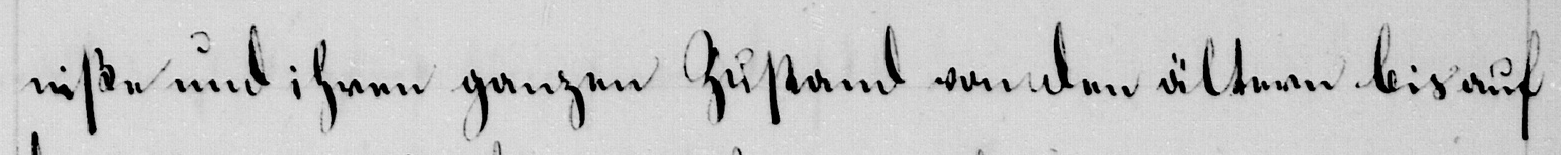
niße und ihren ganzen Zustand von den ältern bis auf
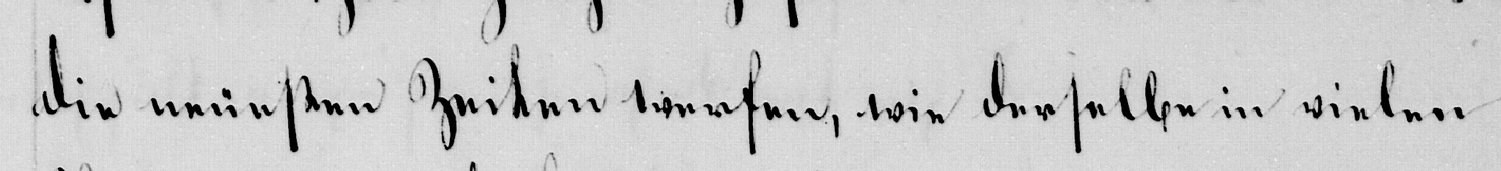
die neusten Zeiten werfen, wie derselbe in vielen
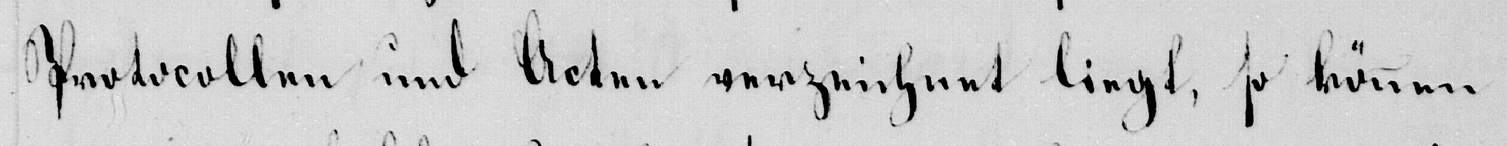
Protocollen und Acten verzeichnet liegt, so können
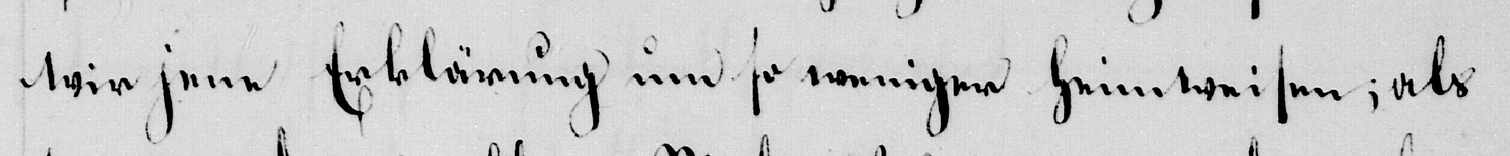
wir jene Erklärung um so weniger heimweisen; als
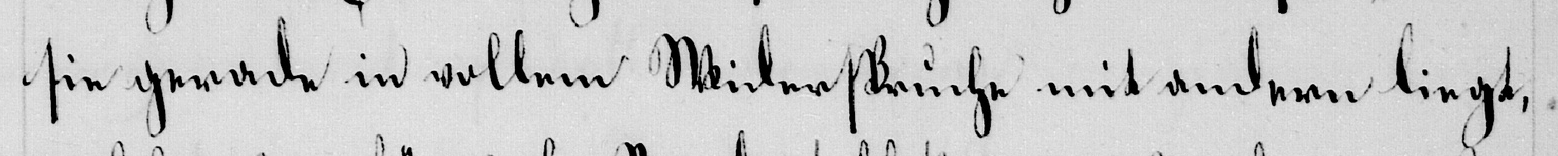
sie gerade in vollem Widerspruche mit andern liegt,
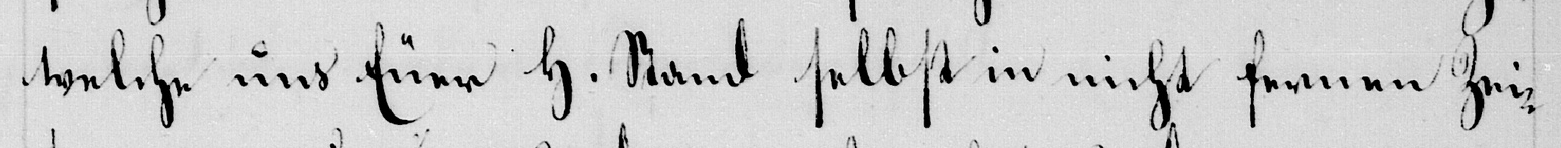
welche uns Euer H. Stand selbst in nicht fernen Zei¬
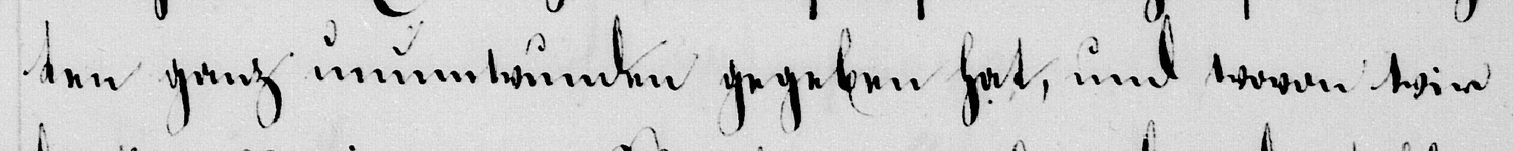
ten ganz unumwunden gegeben hat, und wovon wir
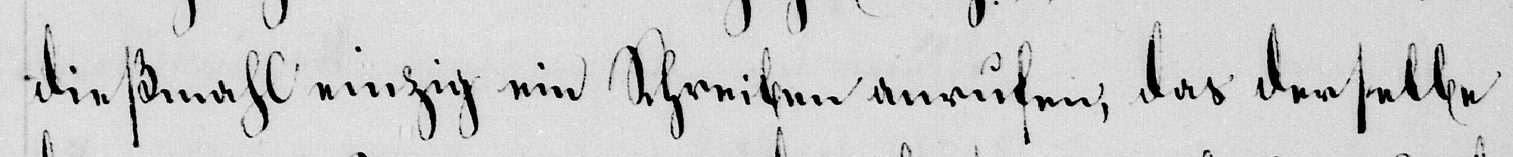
dießmahl einzig ein Schreiben anrufen, das derselbe
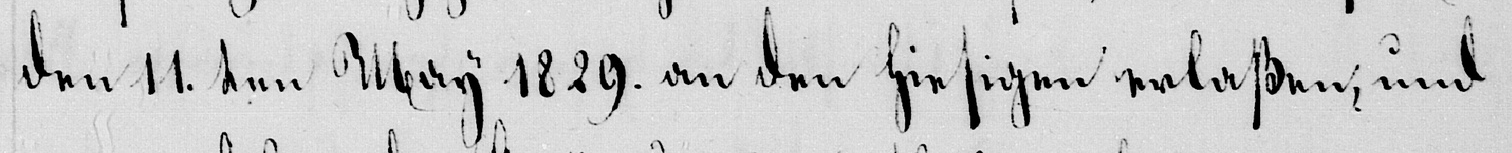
den 11.ten May 1829. an den hiesigen erlaßen, und
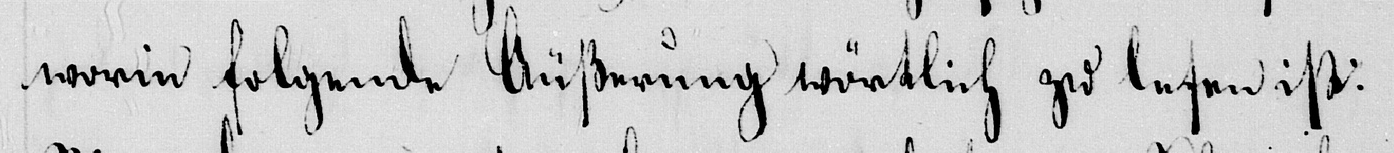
worin folgende Äußerung wörtlich zu lesen ist:
